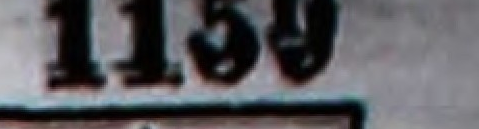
1159
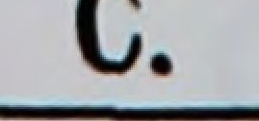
C.
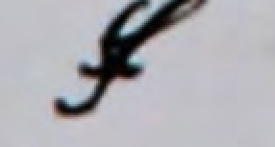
F
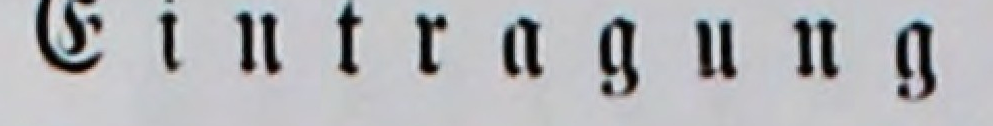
Eintragung
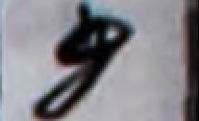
G
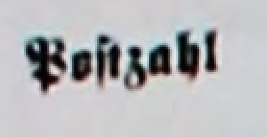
Postzahl
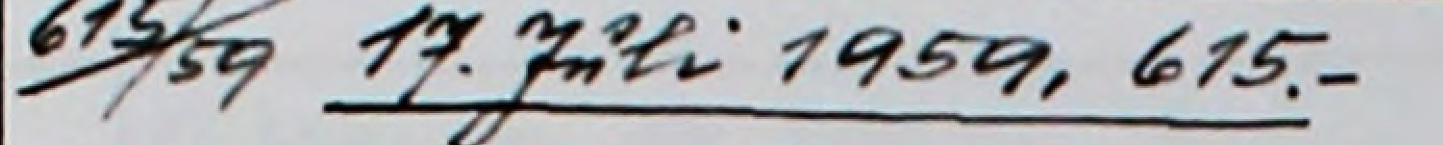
615/59 17. Juli 1959, 615.-
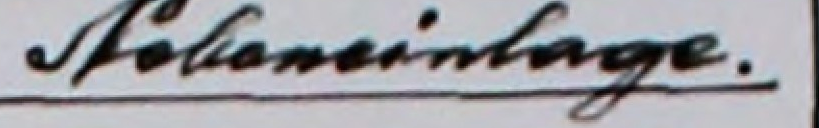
Stöbeneinlage.
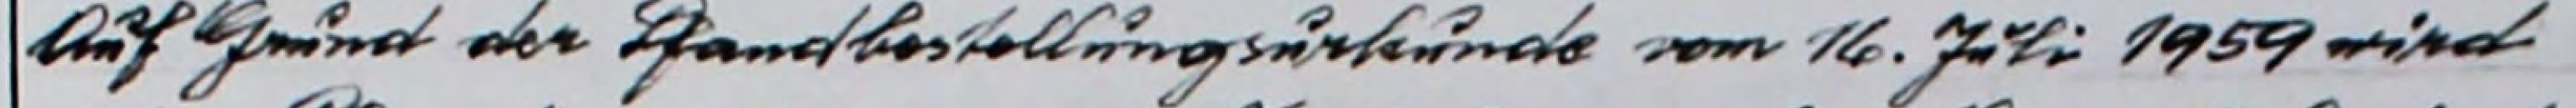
Auf Grund der Pfandbestellungsurkunde vom 16. Juli 1959 wird
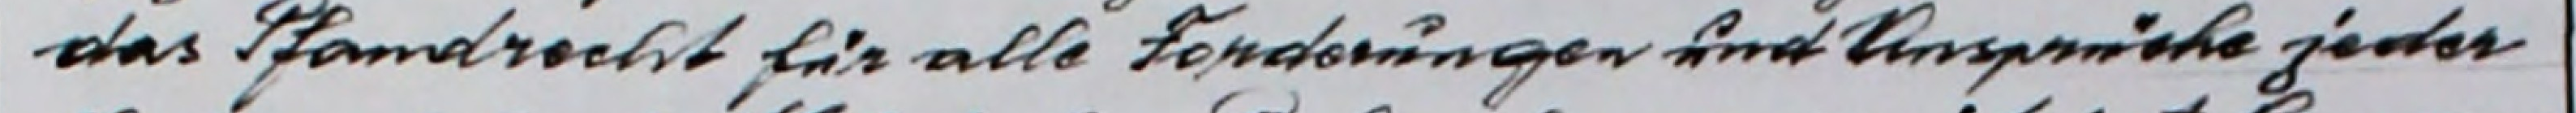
das Pfandrecht für alle Forderungen und Ansprücke jeder
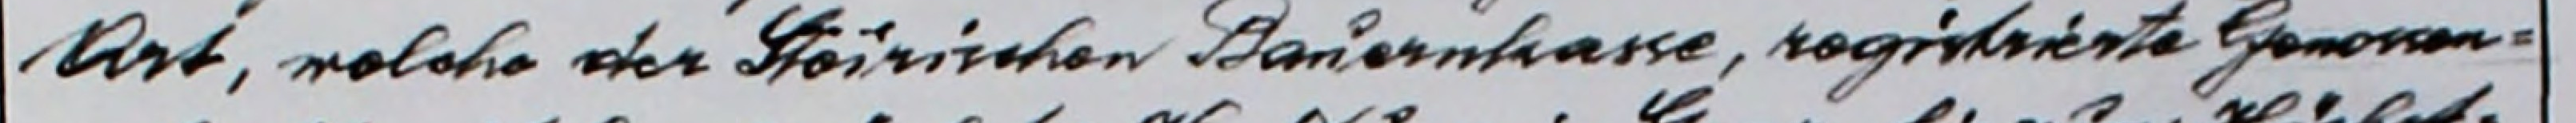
Art, welche der Stösrichen Bauernhasse, Registrierte Genossen=
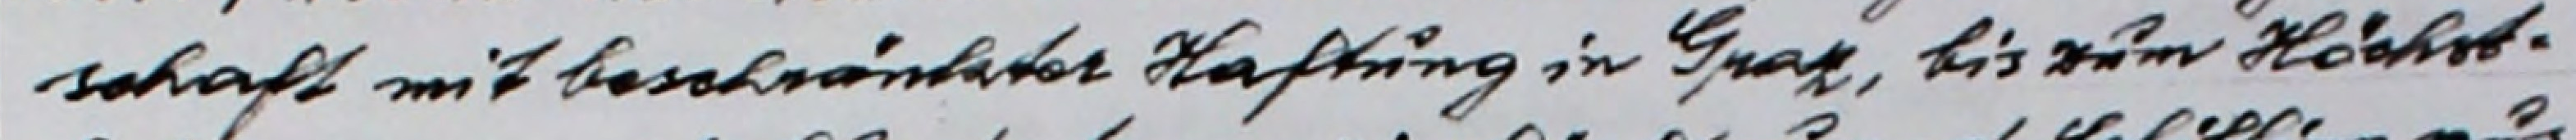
schaft mit beschränkter Haftung in Graz, bis zum Höchst
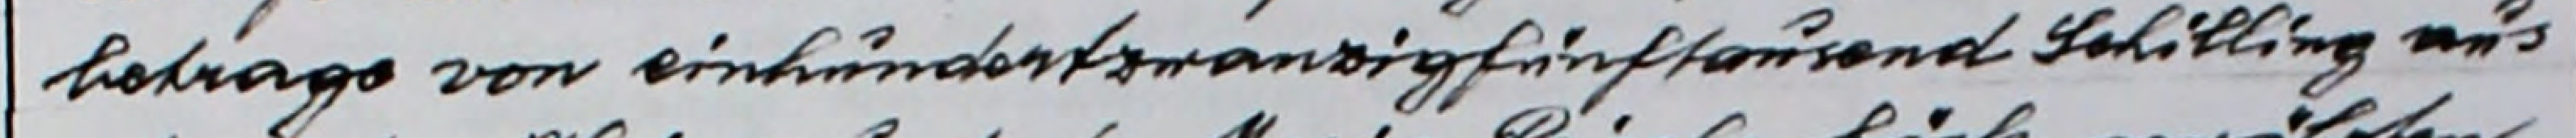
betrage von einhundertzwanzigfünftausend Schilling aus
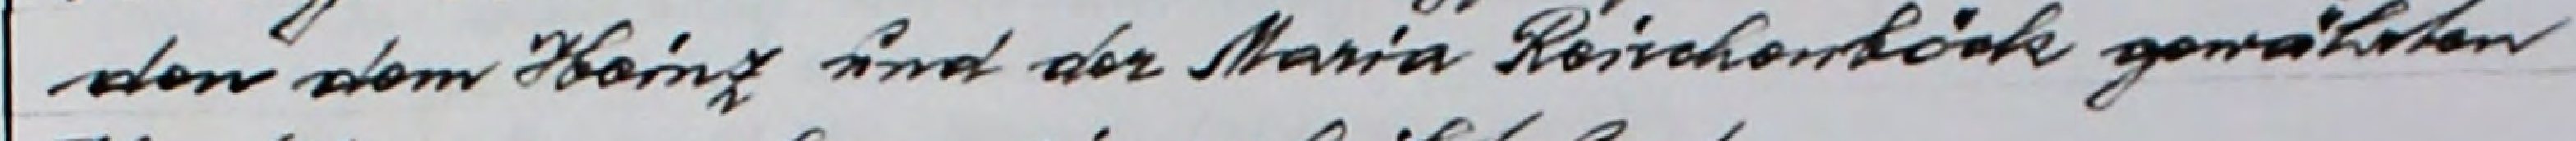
den dem Heinz und der Maria Reischenböck gewährten
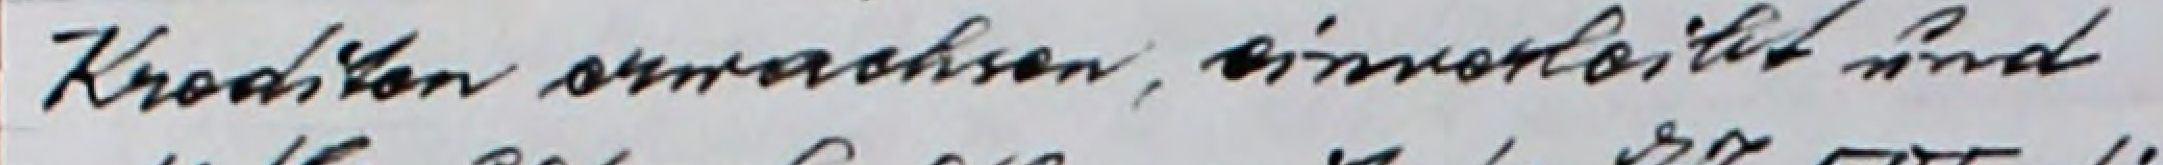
Krodston erwachten, einverleibt und
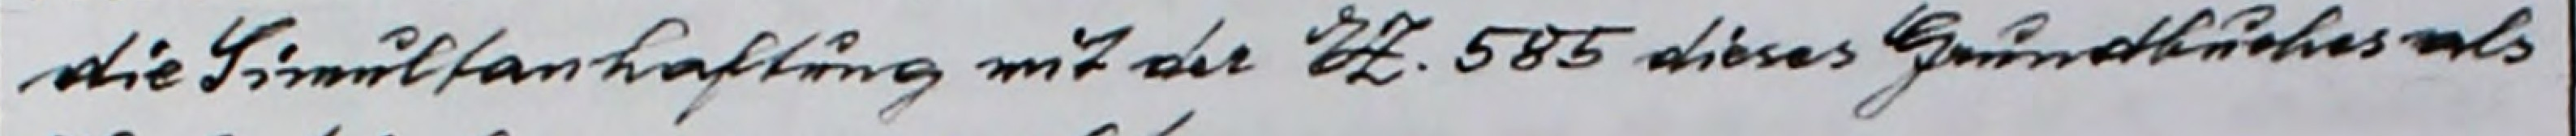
die Simulsanhoftung mit der EZ. 585 dieses Zeundbuches als
